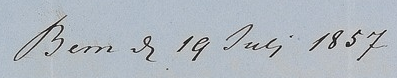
Bern den 19 Juli 1857
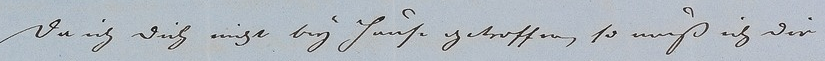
Da ich Dich nicht bey Hause getroffen, so muß ich Dir
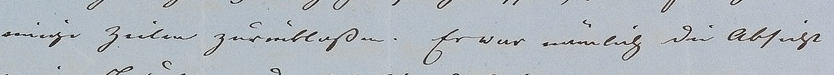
einige Zeilen zurücklassen. Es war nämlich die Absicht
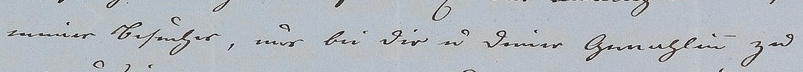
meines Besuches, uns bei Dir u Deiner Gemahlin zu
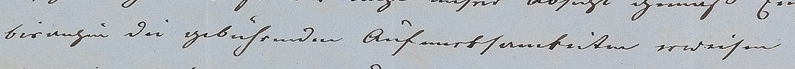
bis anhin die gebührenden Aufmerksamkeiten erweisen
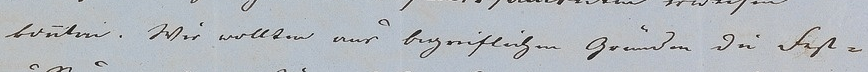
konnten. Wir wollten aus begreiflichen Gründen die Fest-
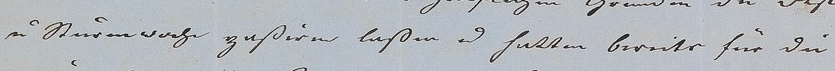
u Sturmwoche passiren lassen u hatten bereits für die
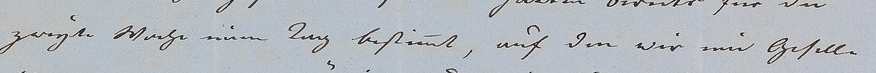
zweyte Woche einen Tag bestimmt, auf den wir eine Gesell-
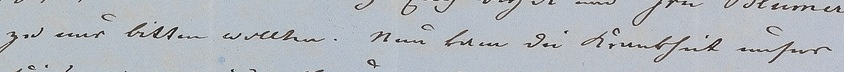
zu uns bitten wollten. Nun kam die Krankheit unsrer
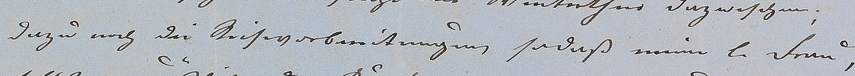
dazu noch die Reisevorbereitungen, sodaß meine l. Frau,
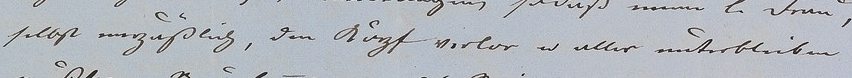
selbst unpäßlich, den Kopf verlor u alles unterbleiben
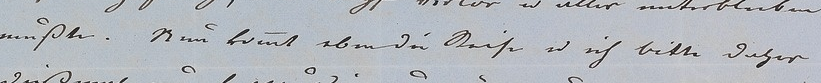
mußte. Nun kommt eben die Reise u ich bitte daher
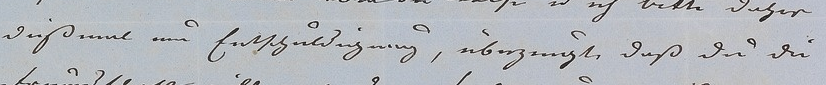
dießmal um Entschuldigung, überzeugt, daß du die
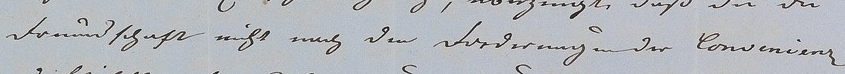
Freundschaft nicht nach den Forderungen der Convenienz
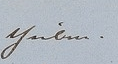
theilen.
